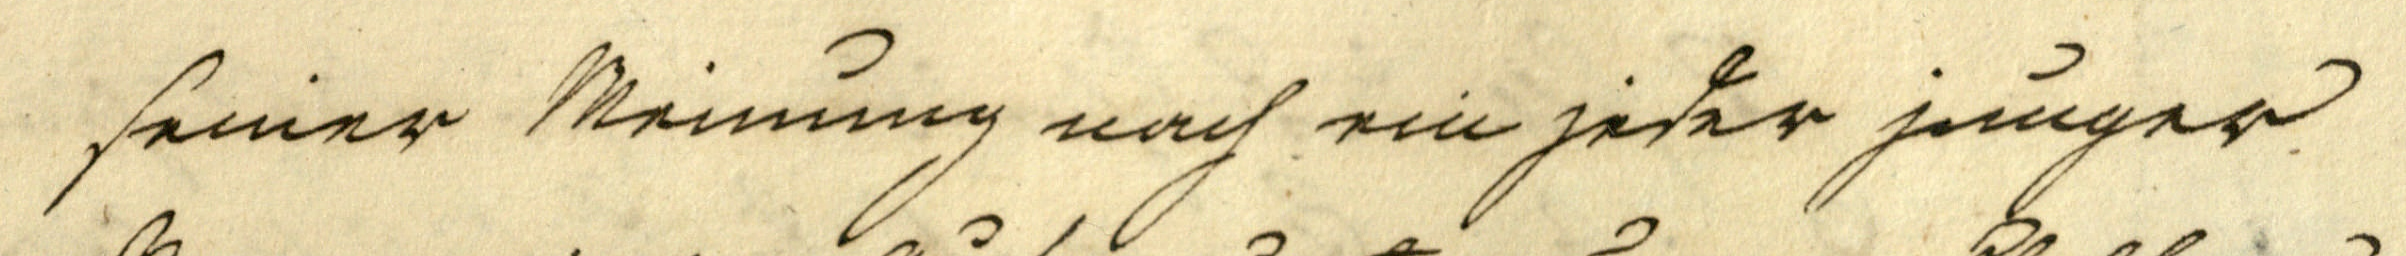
seiner Meinung nach ein jeder junger
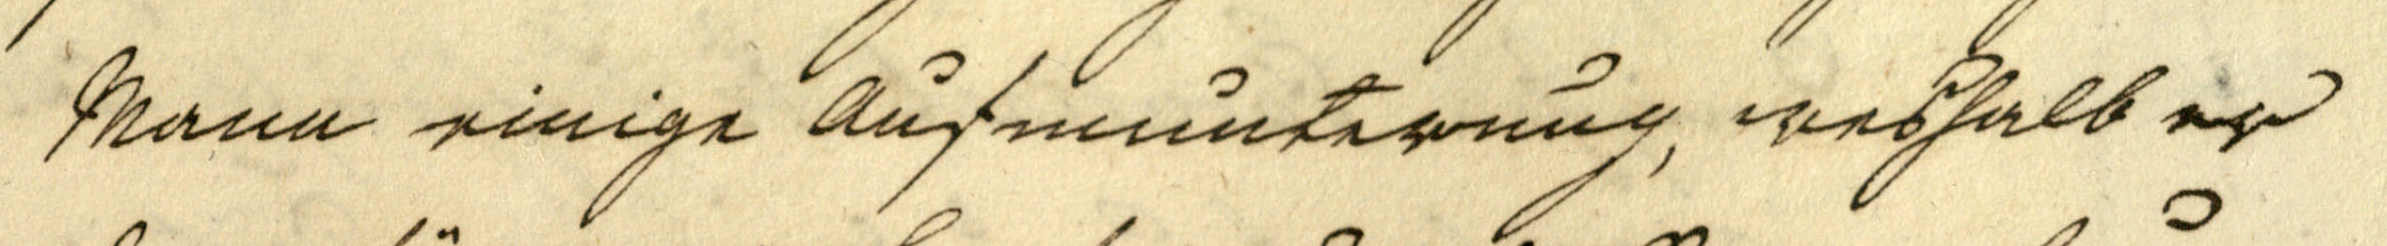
Mann einige Aufmunterung, weshalb er
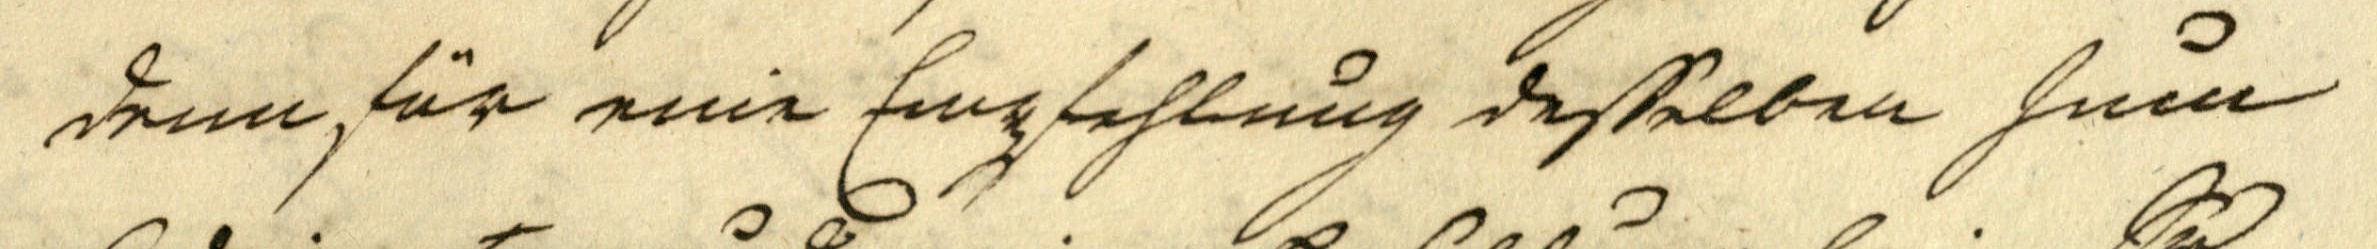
denn für eine Empfehlung desselben zum
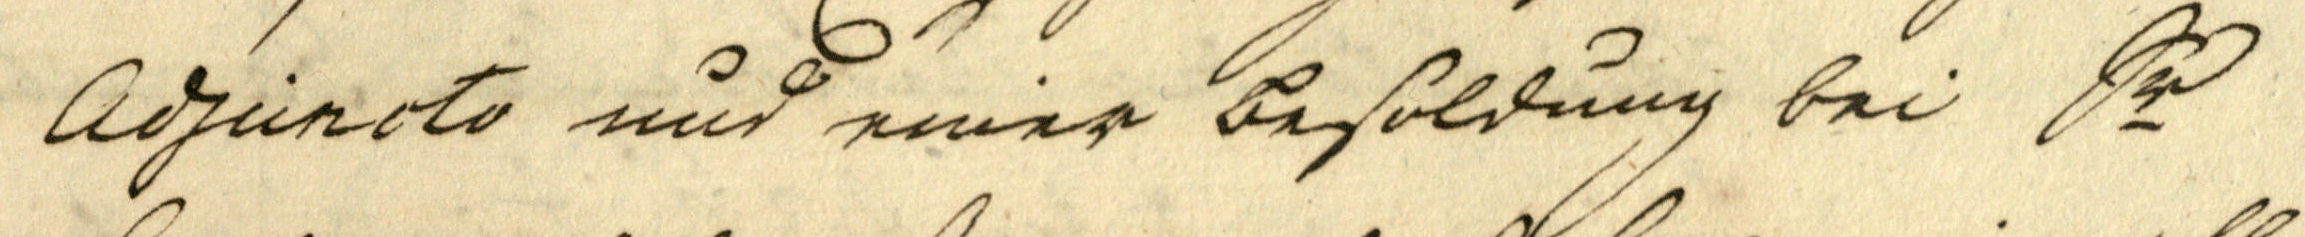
Adjuncto und einer Besoldung bei Sr.
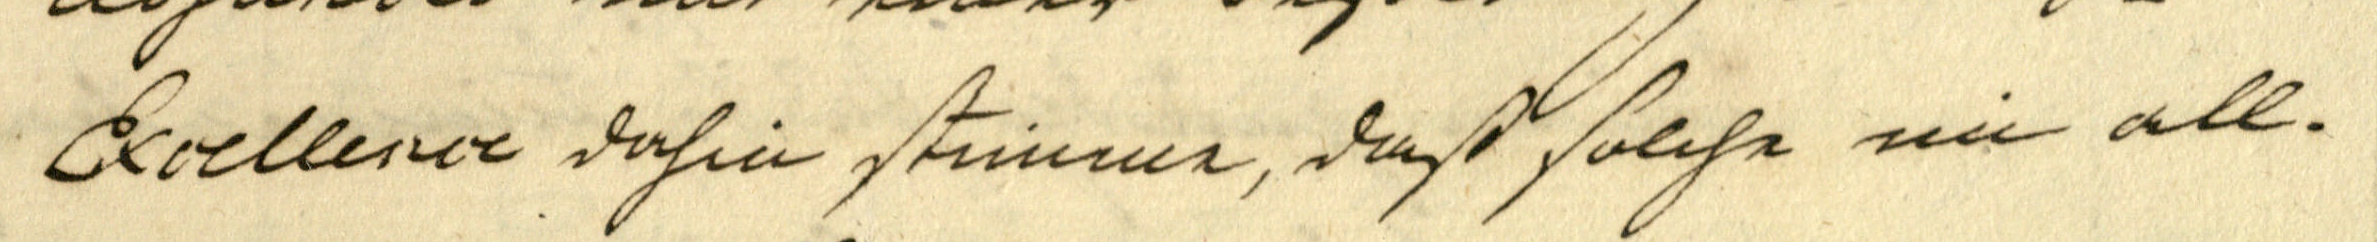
Excellence dahin stimme, daß solche im all-
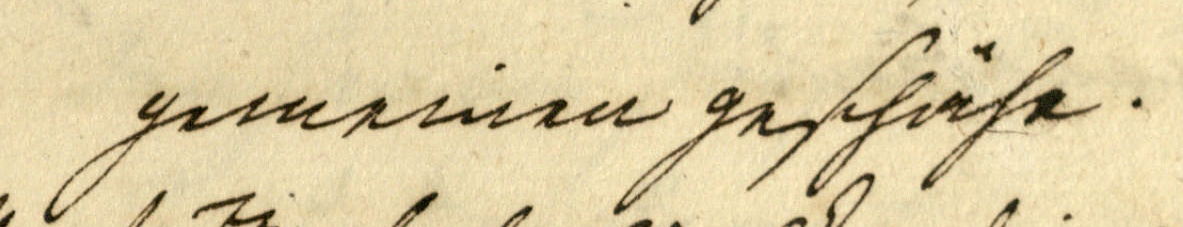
gemeinen geschähe.
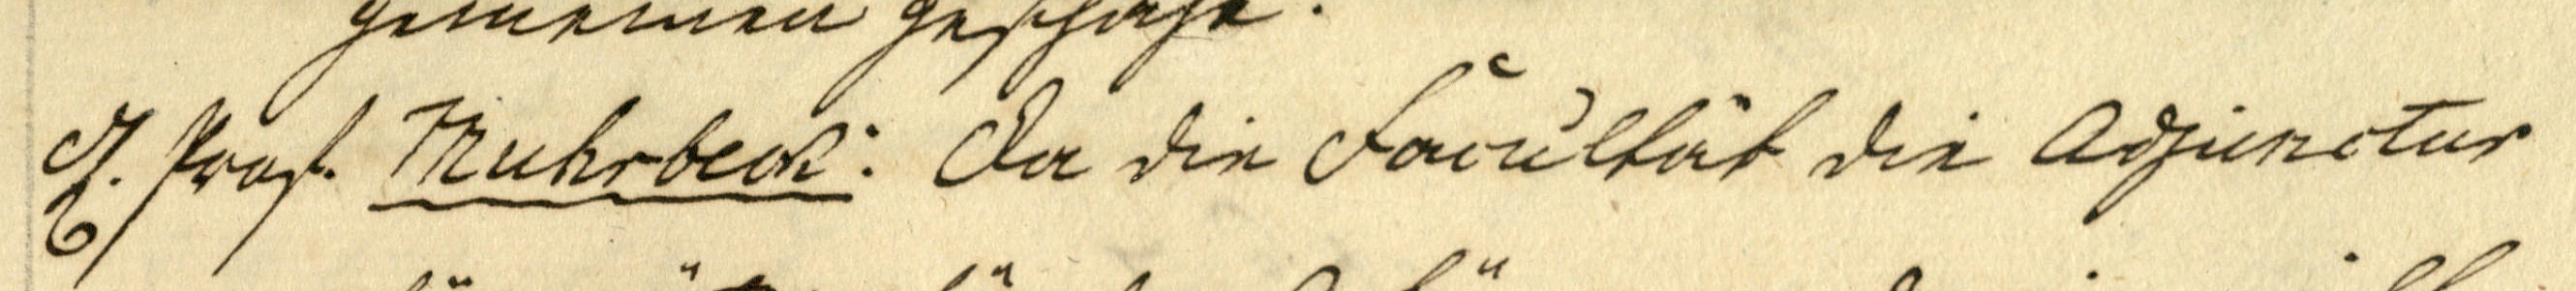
dh. Prof. Muhrbeck: Da die Facultät die Adjunctur
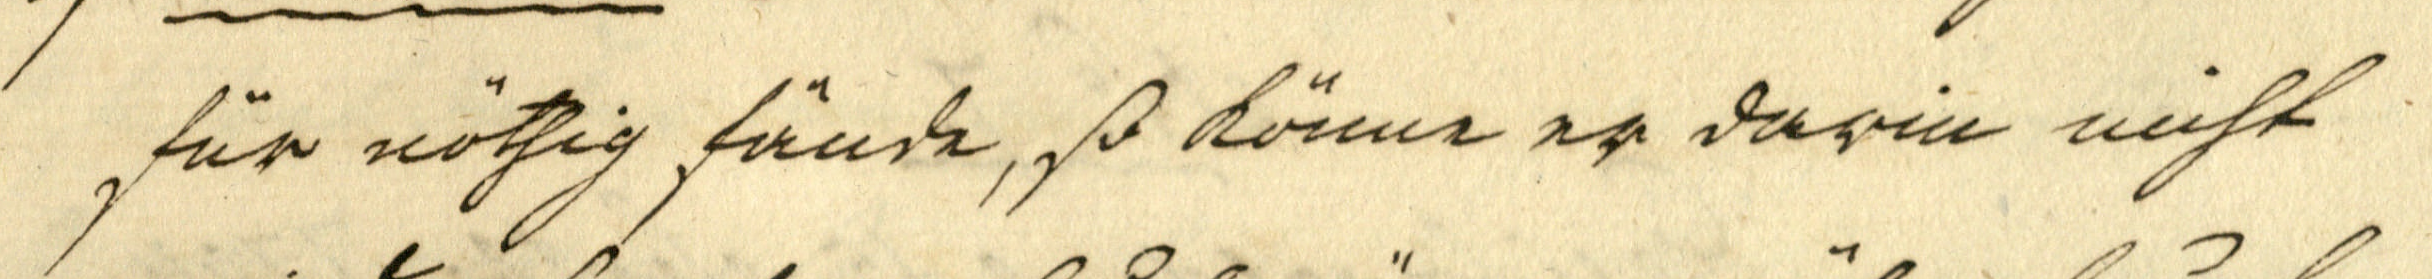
für nöthig fände, so könne er darin nicht
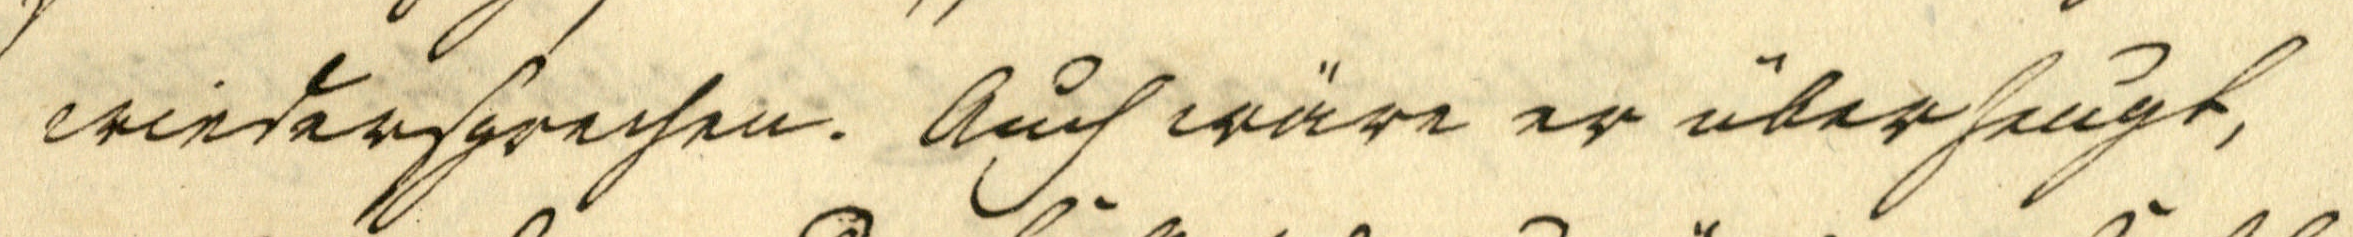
wiedersprechen. Auch wäre er überzeugt,
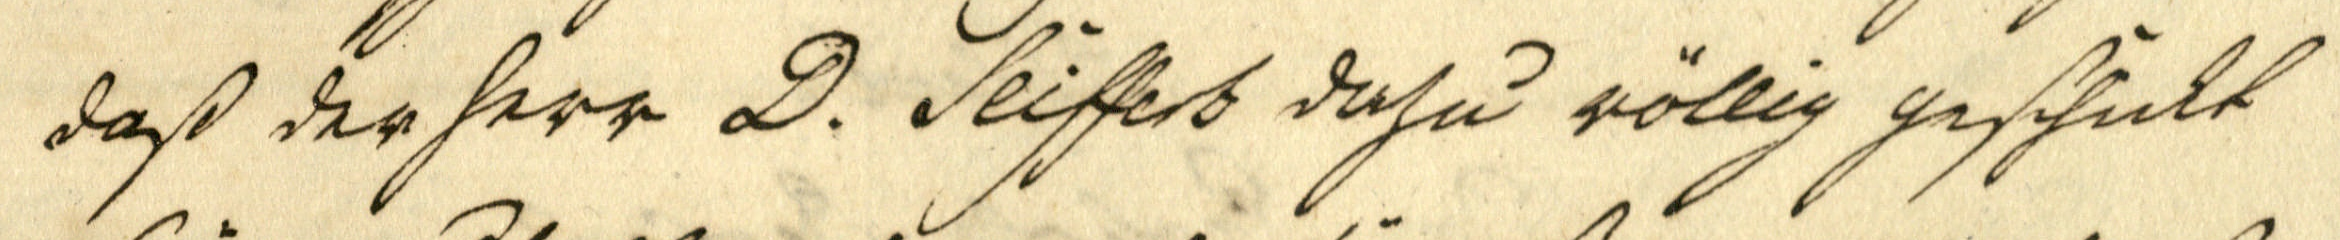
daß der herr D. Seiffert dazu völlig geschult
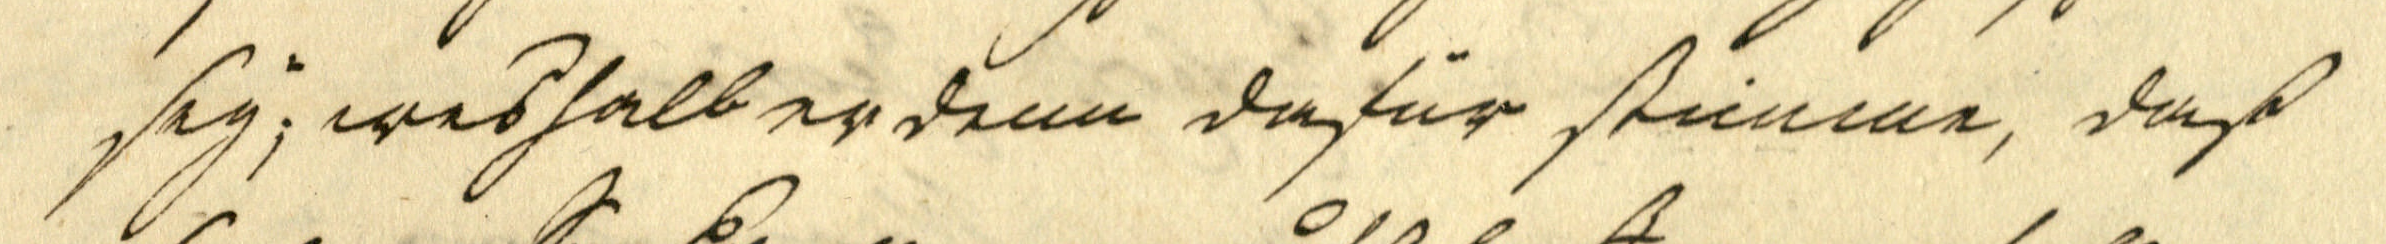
sey; weshalb er denn dafür stimme, daß
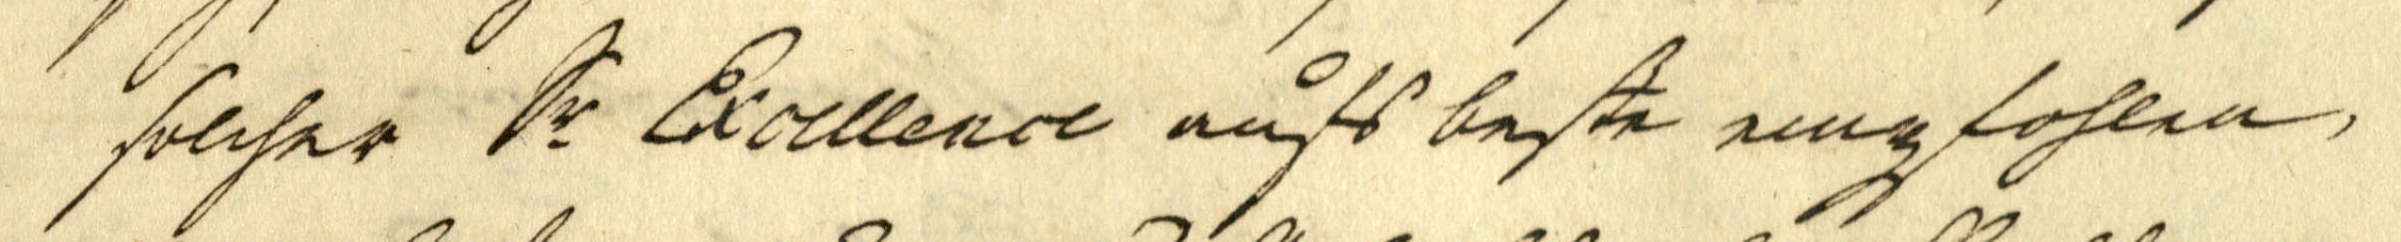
solcher Sr. Excellence aufs beste empfohlen,
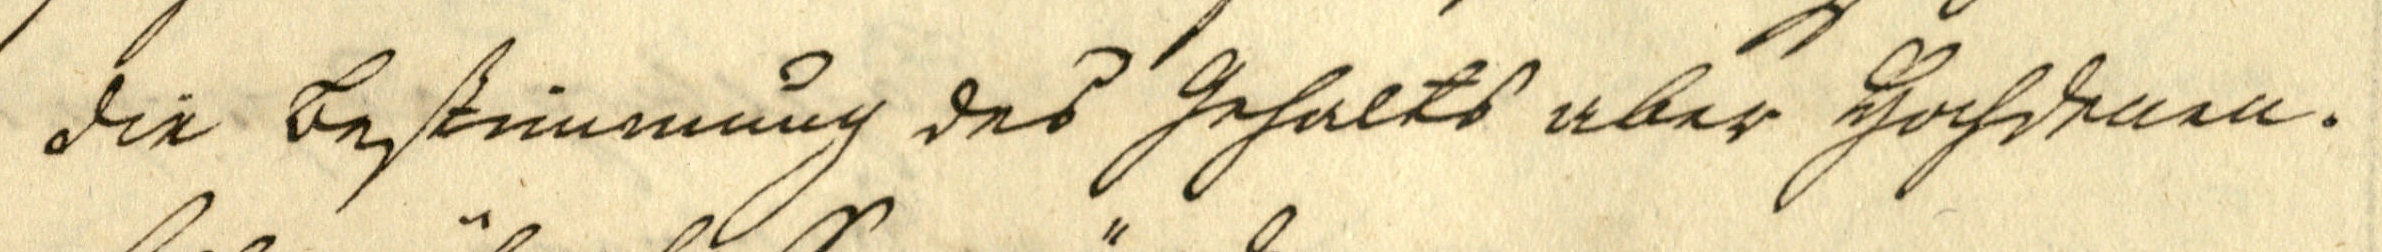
die Bestimmung des Gehalts aber Hochdenen-
